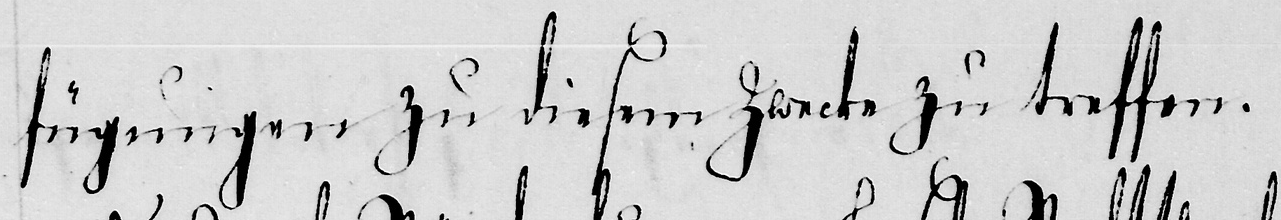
fügungen zu diesem Zwecke zu treffen.
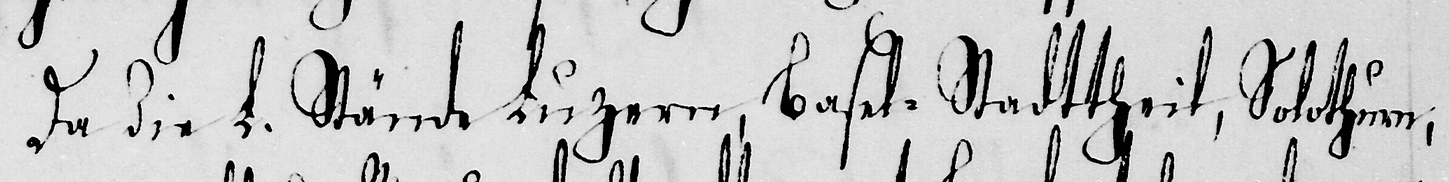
Da die L. Stände Luzern, Basel-Stadttheil, Solothu¬
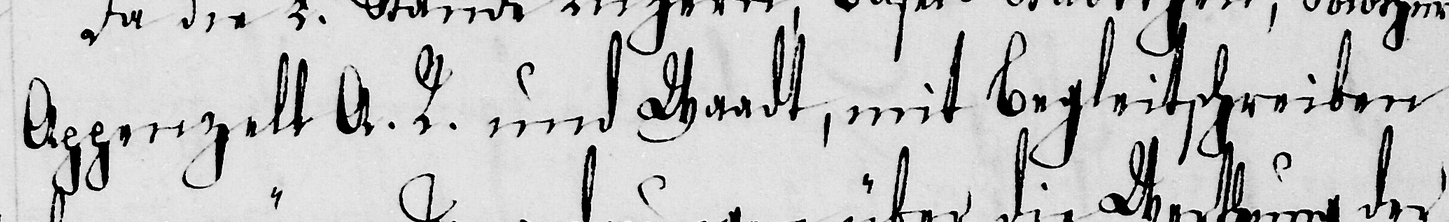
Appenzell A.R. und Waadt, mit Begleitschreiben
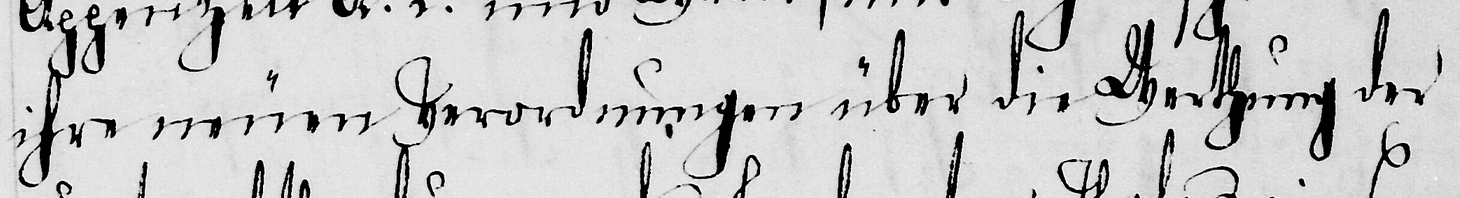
ihre neuen Verordnungen über die Werthung der
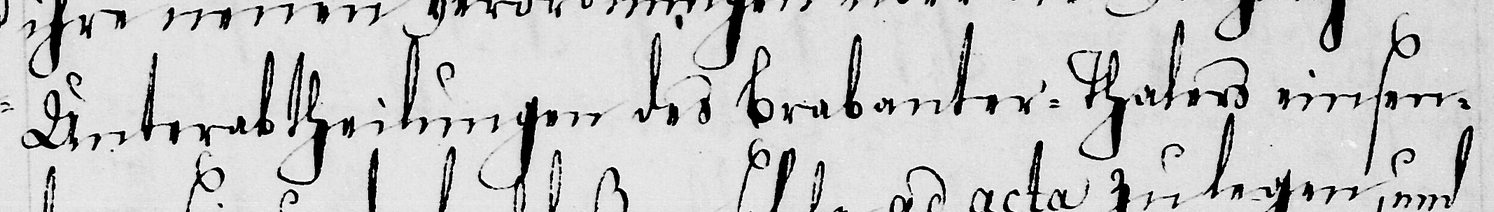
Unterabtheilung des Brabanter-Thalers einsen¬
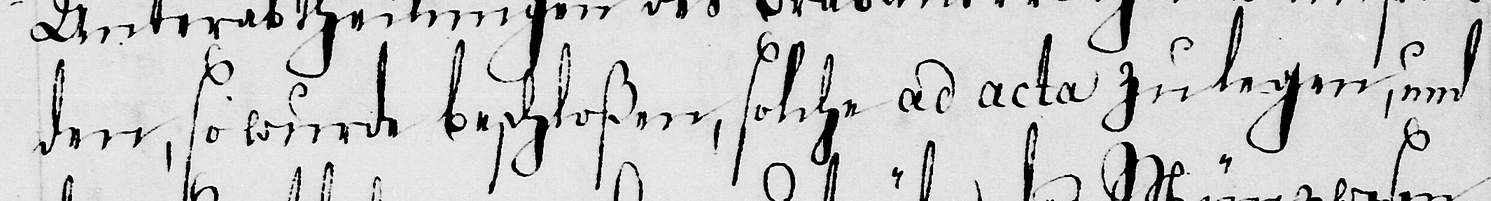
den, so wurde beschloßen, solche ad acta zu legen, und
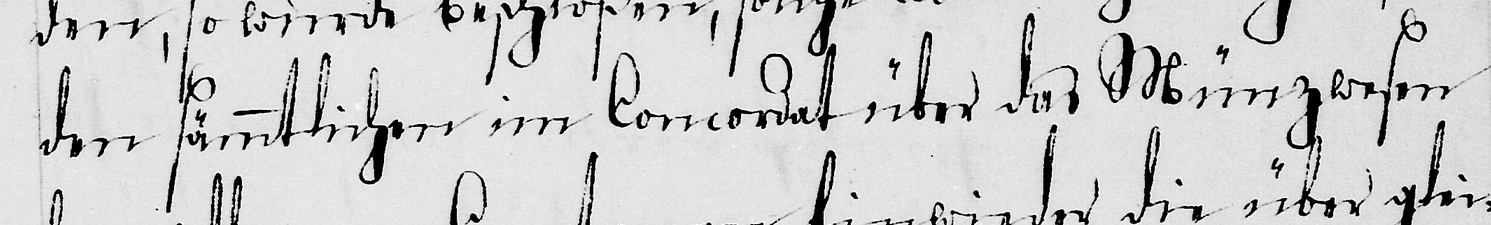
den sämmtlichen im Concordat über das Münzwesen
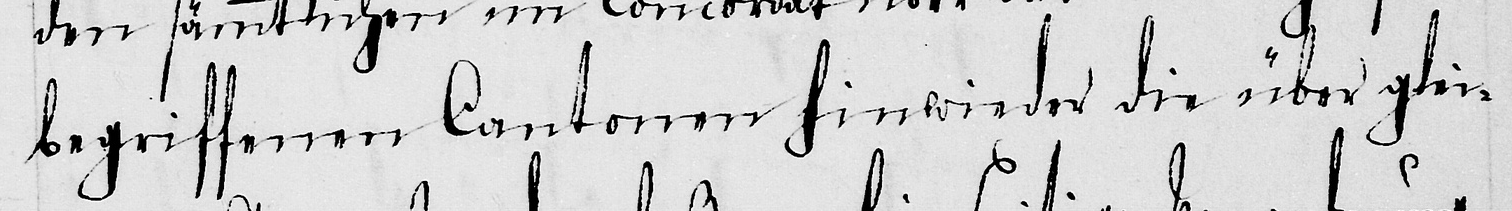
begriffenen Cantonen hinwieder die über glei¬
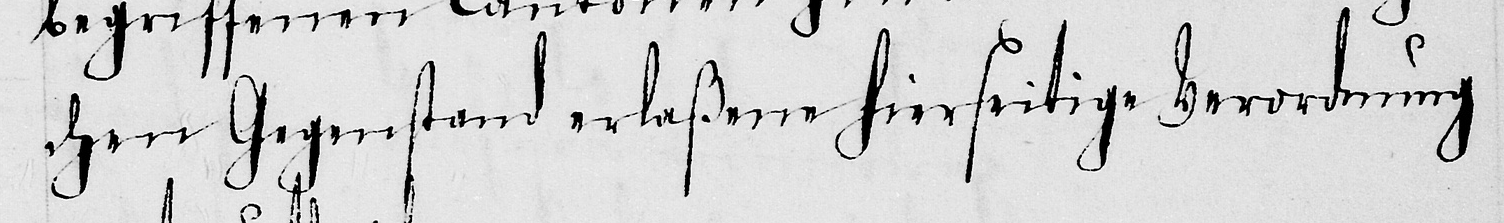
chen Gegenstand erlaßene hierseitige Verordnung
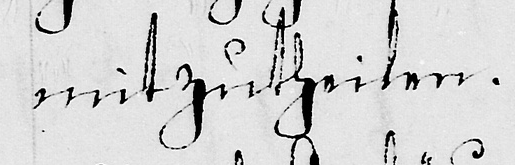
mitzutheilen.
